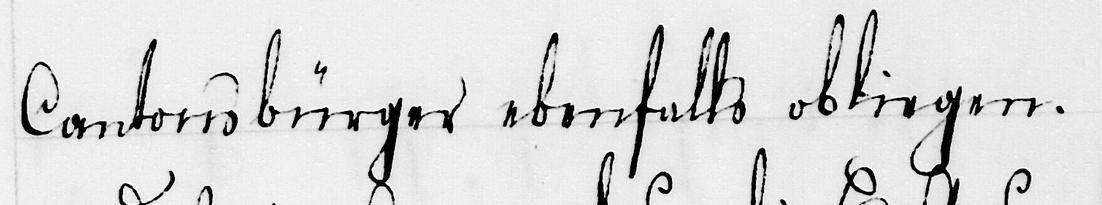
Cantonsbürger ebenfalls obliegen.
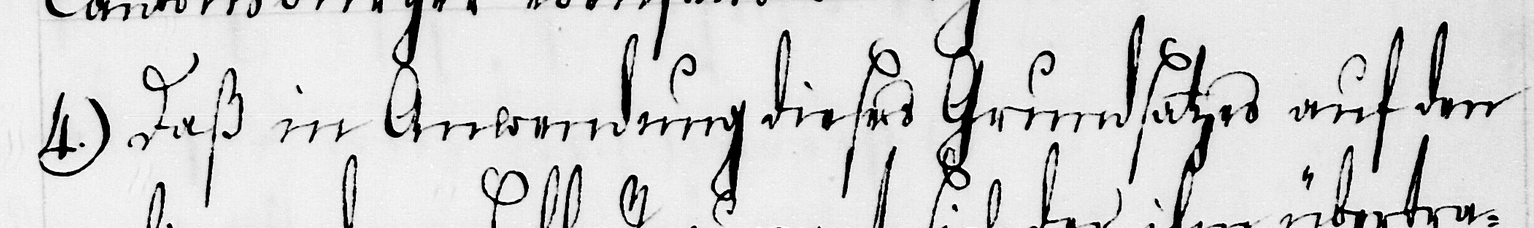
4.) Daß in Anwendung dieses Grundsatzes auf den
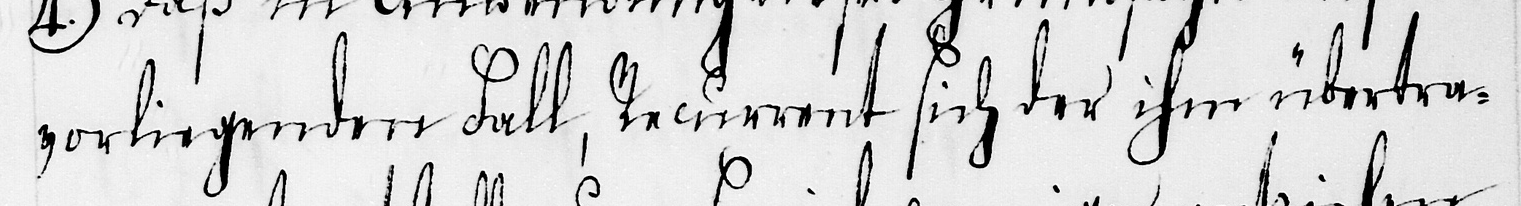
vorliegenden Fall, Recurrent sich der ihm übertra¬
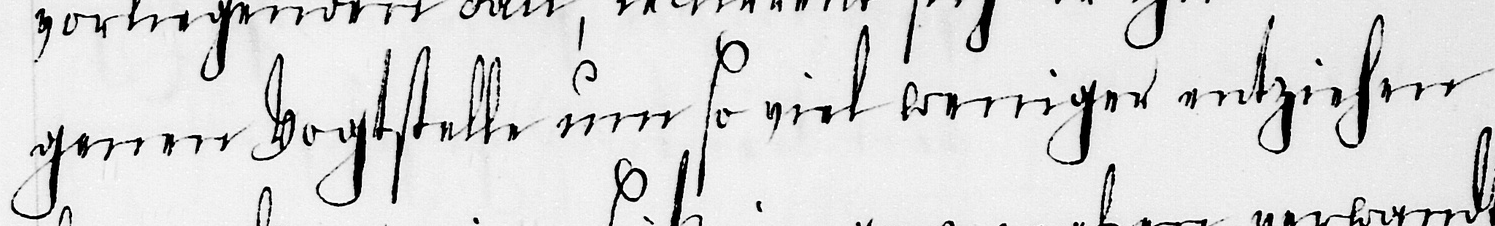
genen Vogtstelle um so viel weniger entziehen
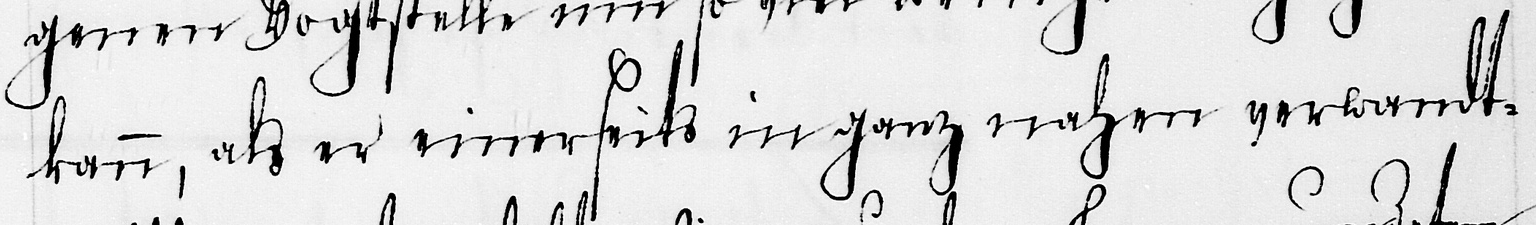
kann, als er einerseits in ganz nahen verwandt¬
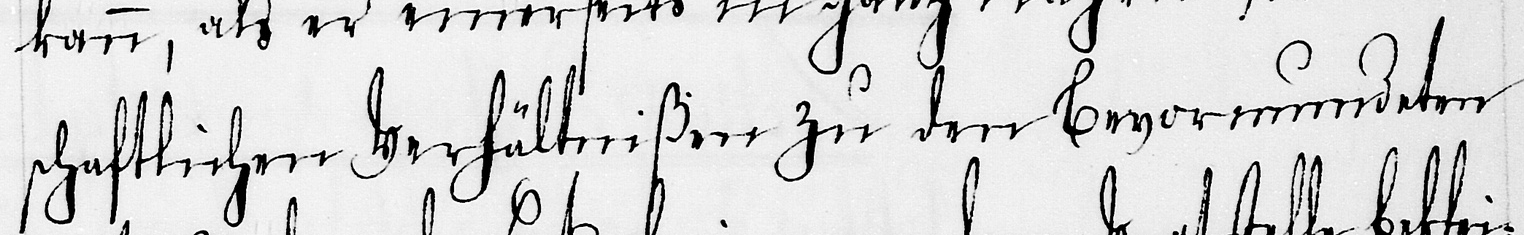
schaftlichen Verhältnißen zu den Bevormundeten
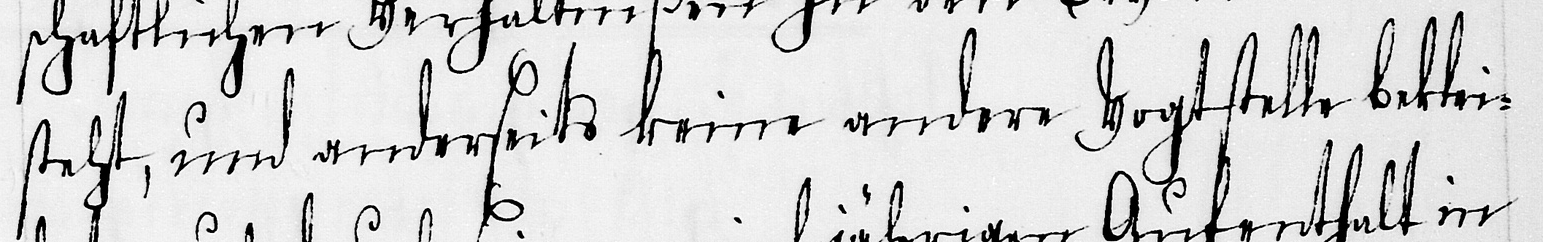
steht, und anderseits keine andere Vogtstelle bekle¬
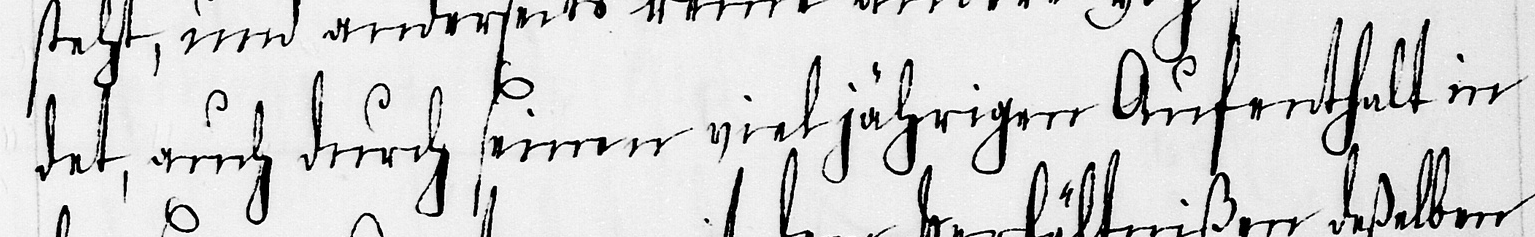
idet, auch durch seinen vieljährigen Aufenthalt in
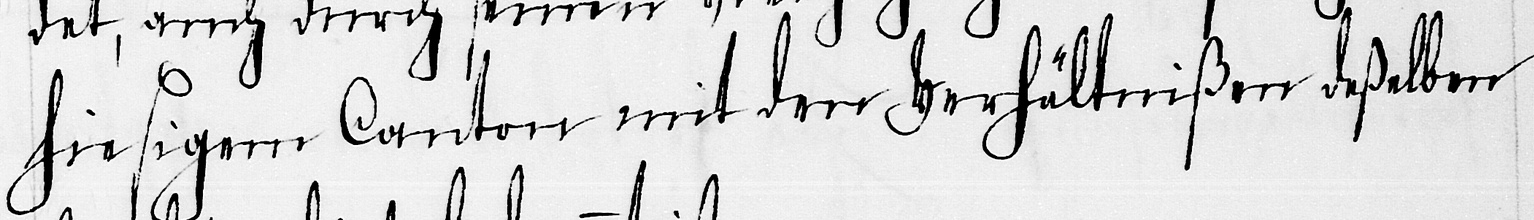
hiesigem Canton mit den Verhältnißen deßelben
